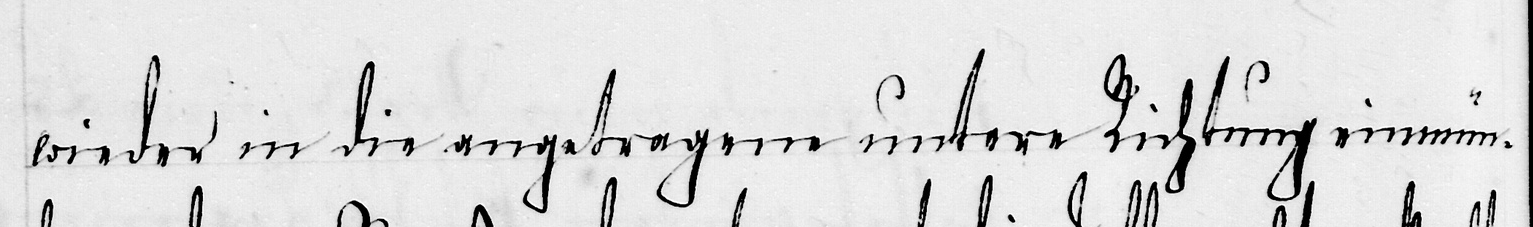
wieder in die angetragene untere Richtung einmün¬
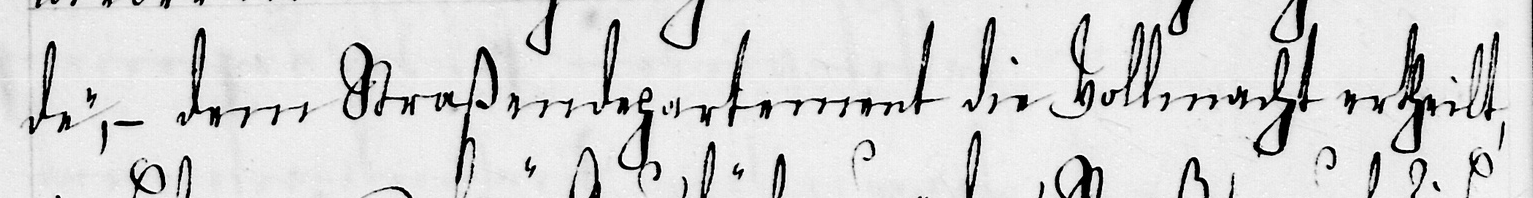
de“, – dem Straßendepartement die Vollmacht ertheil¬
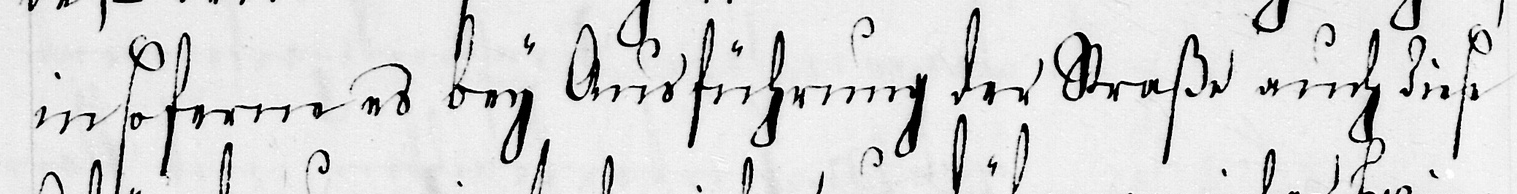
insoferne es bey Ausführung der Straße auch diese
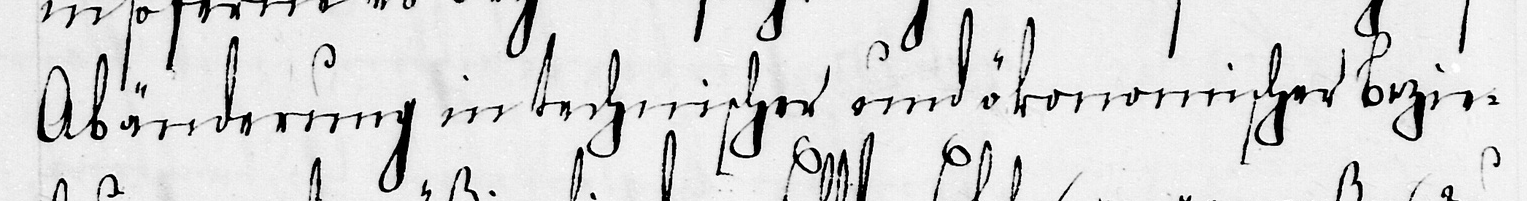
Abänderung in technischer und ökonomischer Bezie¬
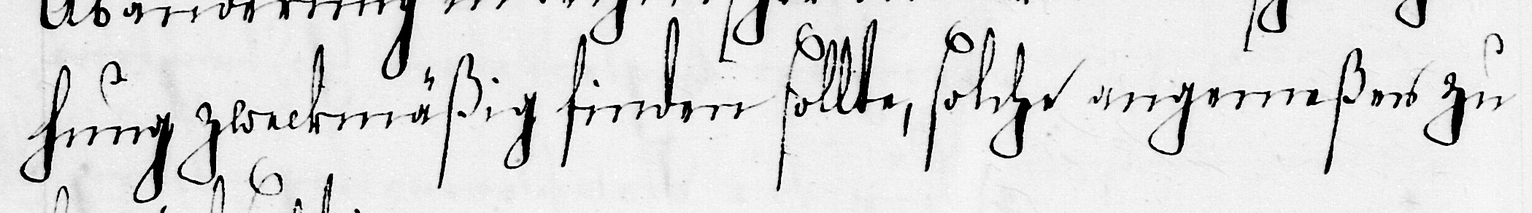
hung zweckmäßig finden sollte, solche angemeßen zu
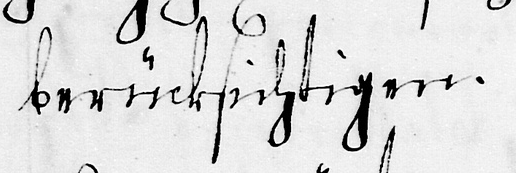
berücksichtigen.
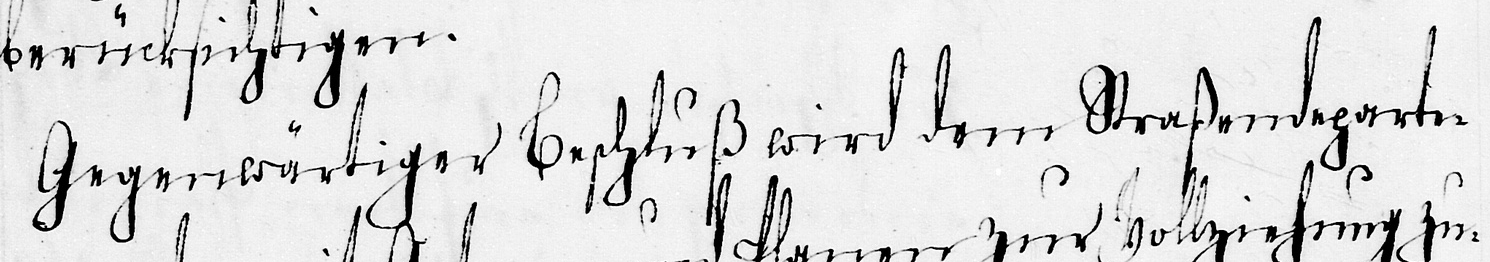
Gegenwärtiger Beschluß wird dem Straßendeparte¬
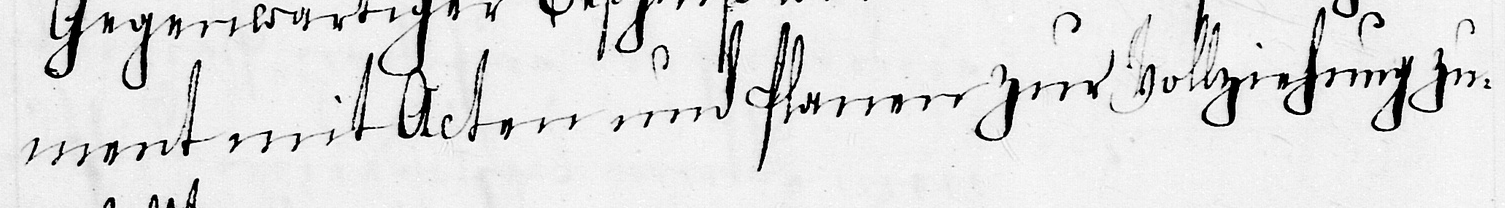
ment mit Acten und Planen zur Vollziehung zu¬
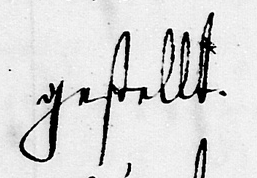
gestellt.
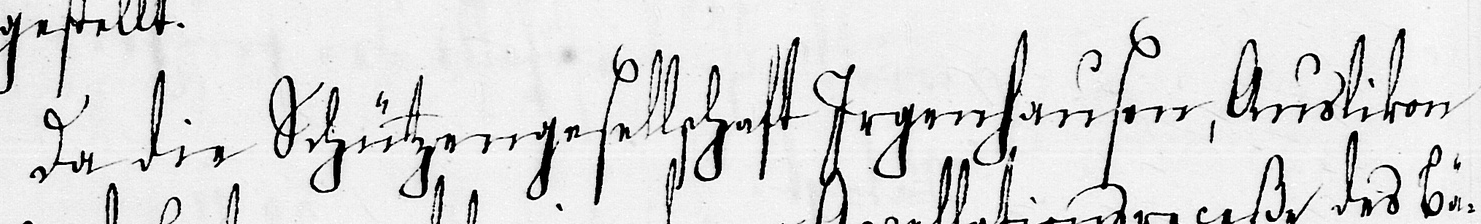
Da die Schützengesellschaft Irgenhausen, Auslikon
